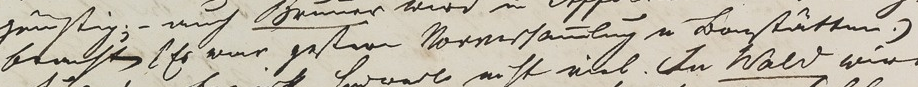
bracht. (Es war gestern Vorversammlung in Bonstätten.)
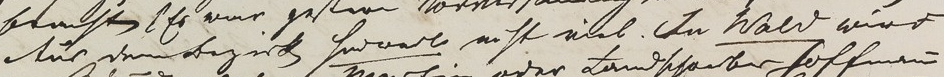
Aus dem Bezirk Hinweil nicht viel. In Wald wird
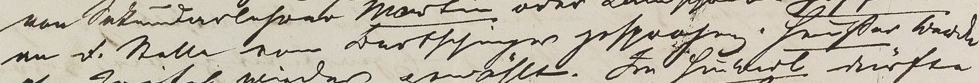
an d. Stelle von Bertschinger gesprochen. Heußer werde
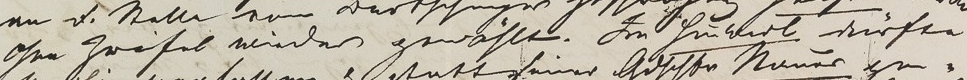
ohne Zweifel wieder gewählt. In Hinweil dürfte
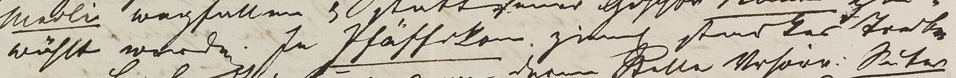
wählt werden. In Pfäffikon ziemlich starkes Treiben
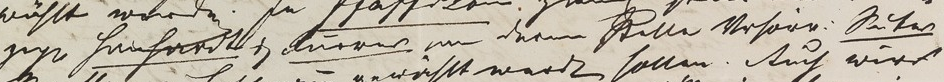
gegen Hanhardt & Furrer an deren Stelle Verhörrichter Suter
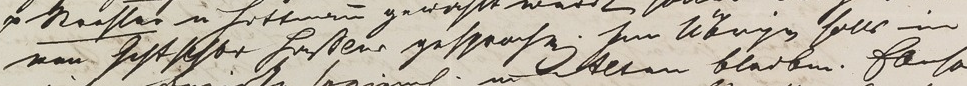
von Gchtschbr Haßler gesprochen. Im Übrigen solls in
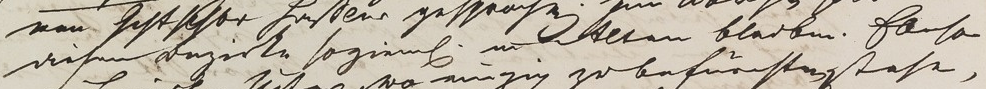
diesem Bezirke so zieml. in Alten bleiben. Ebenso
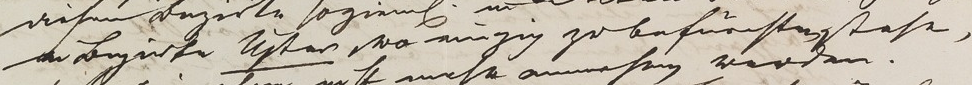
im Bezirke Uster, wo einzig zu befürchten stehe,
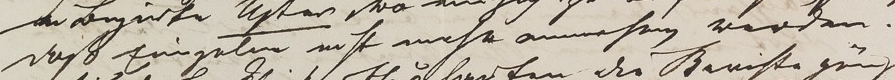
daß Einzelne nicht mehr annehmen werden.
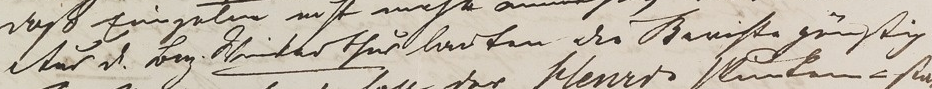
Aus d. Bez. Winterthur lauten die Berichte günstig.
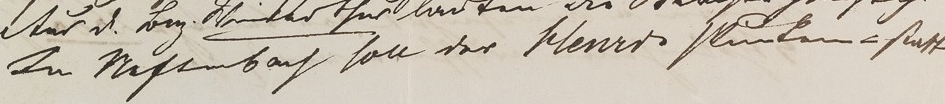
In Neftenbach soll der Henri spucken ­ statt
